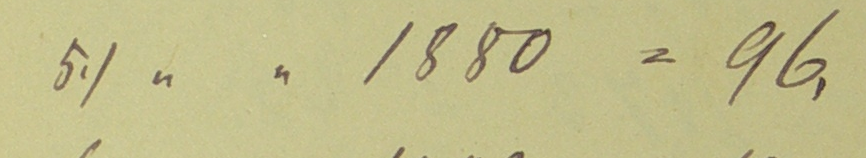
5) * 1880 = 96
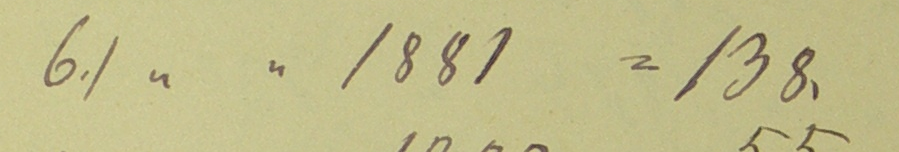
6) * 1881 = 138
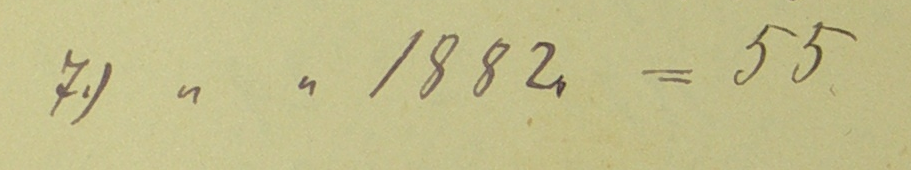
7) * 1882 = 55
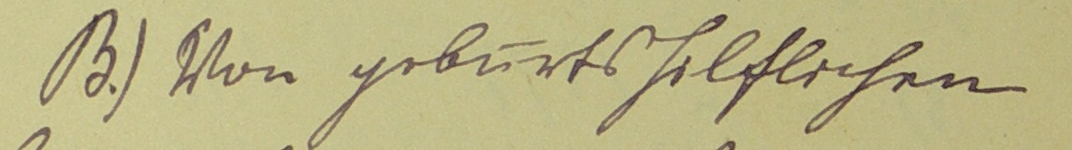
B.) Von geburtshilflichen
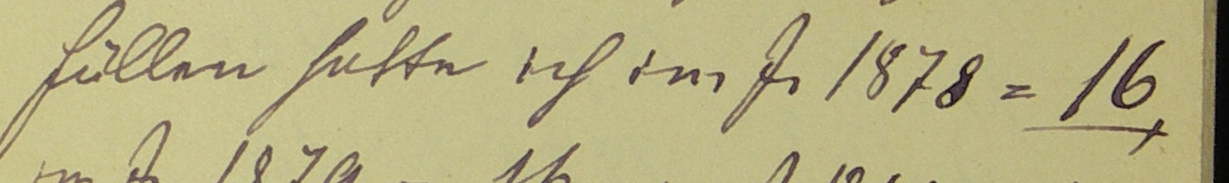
Fällen hatte ich im Jahr 1878= 16;
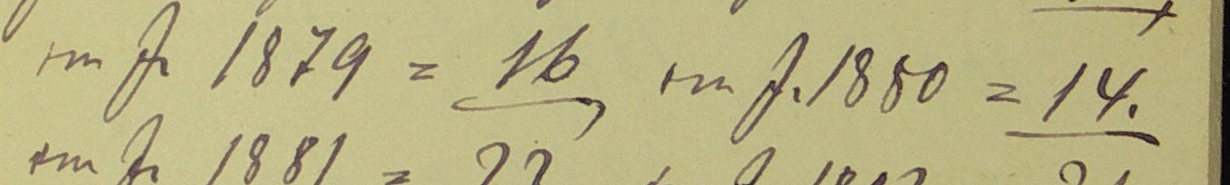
Im J. 1879=16; im J. 1880 = 14;
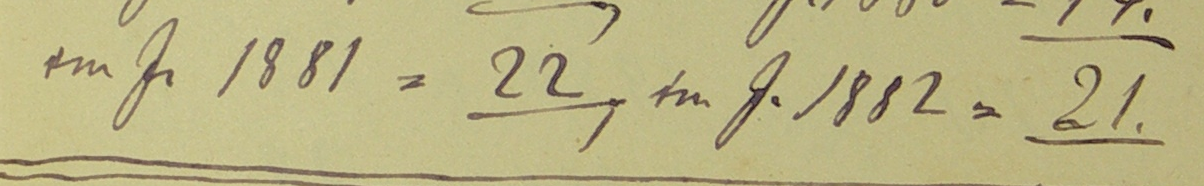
im J. 1881 =22; im J. 1882 = 21.
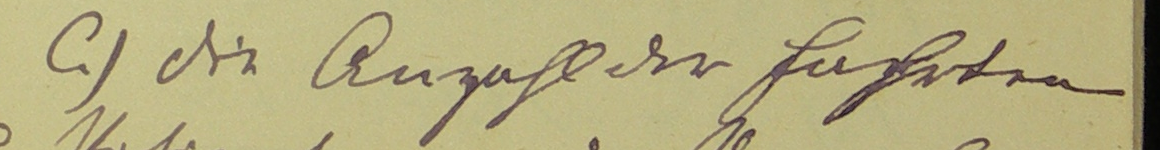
C.) Die Anzahl der Fahrten
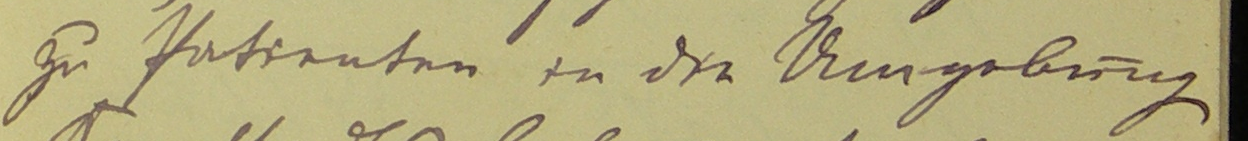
zu Patienten in der Umgebung
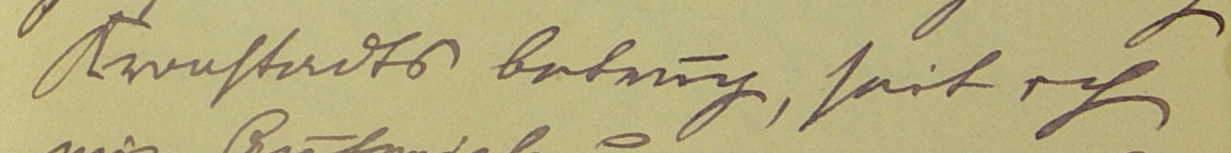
Kronstadts betrug, seit ich
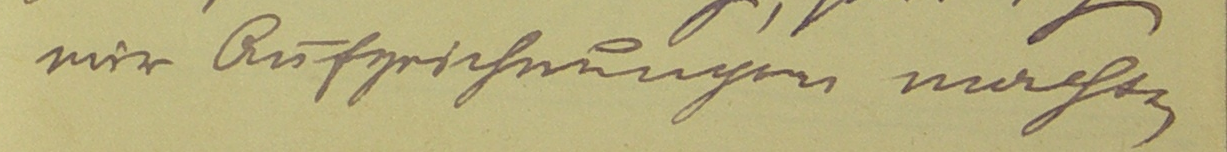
mir Aufzeichnungen machte:..
